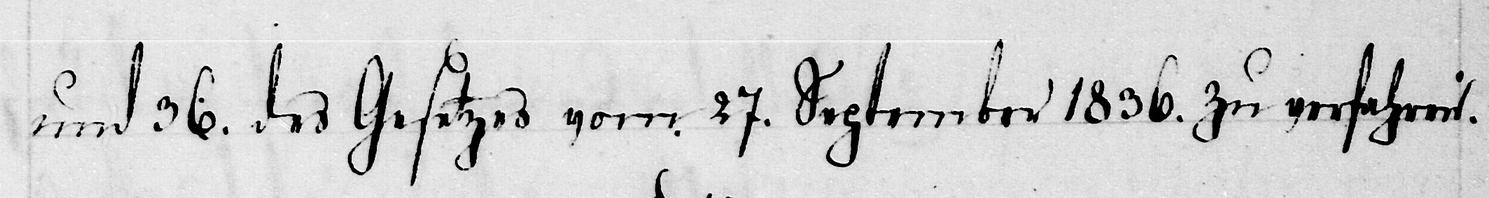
und 36. des Gesetzes vom 27. September 1836. zu verfahren.
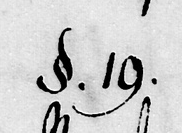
§. 19.
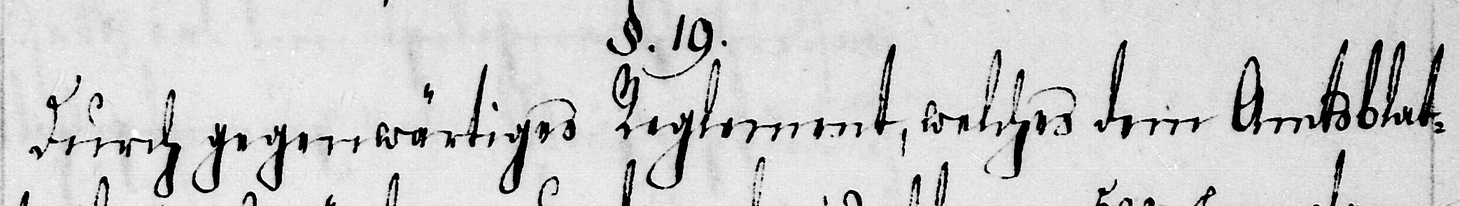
Durch gegenwärtiges Reglement, welches dem Amtsblat¬
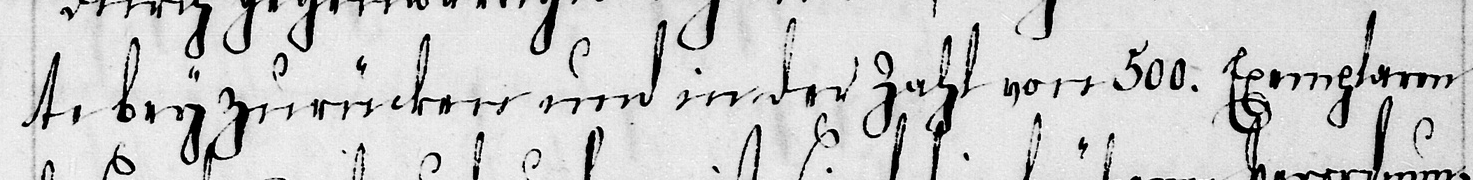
te beyzurücken und in der Zahl von 500. Exemplaren
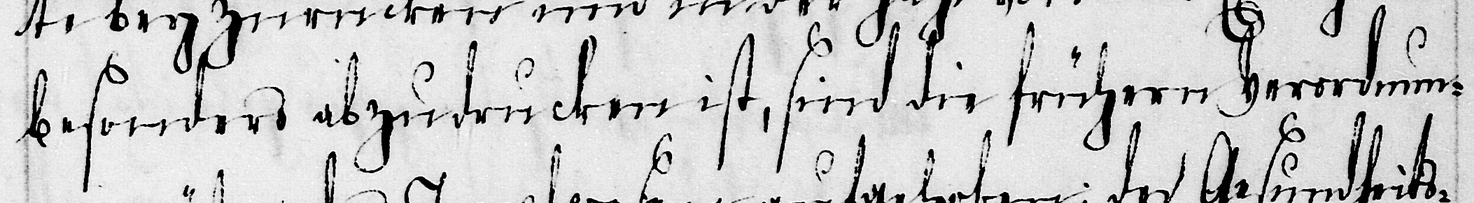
besonders abzudrucken ist, sind die frühern Verordnun¬
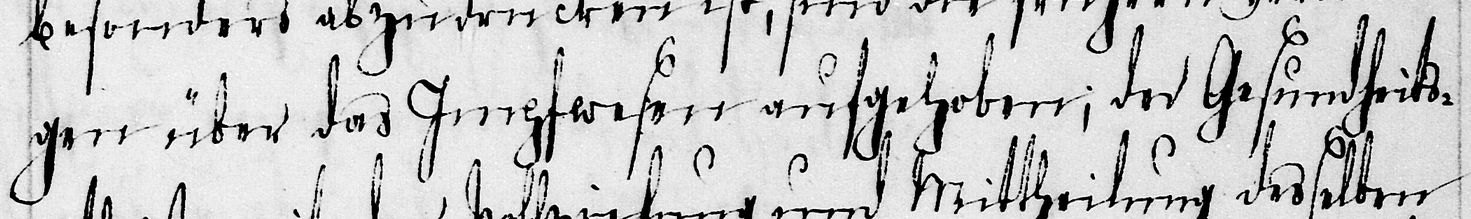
gen über das Impfwesen aufgehoben; der Gesundheits¬
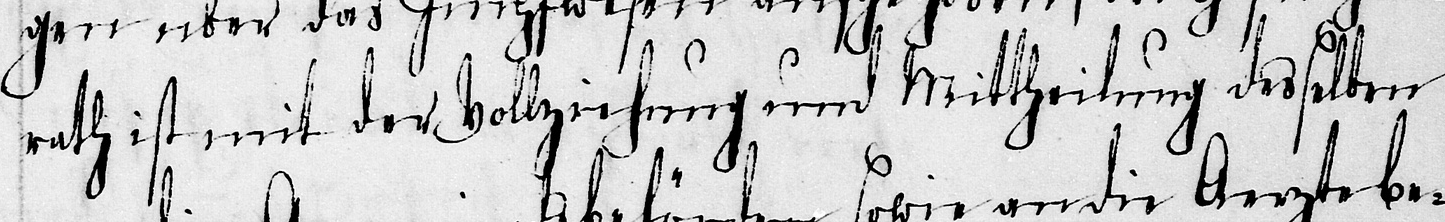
rath ist mit der Vollziehung und Mittheilung desselben
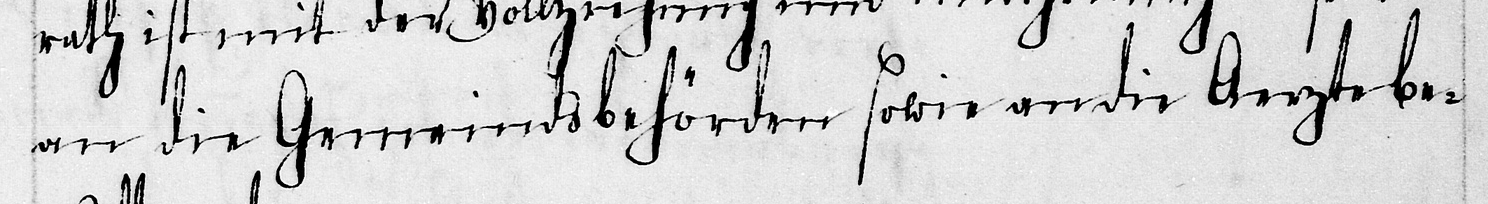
an die Gemeindsbehörden sowie an die Aerzte be¬
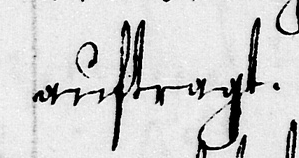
auftragt.
